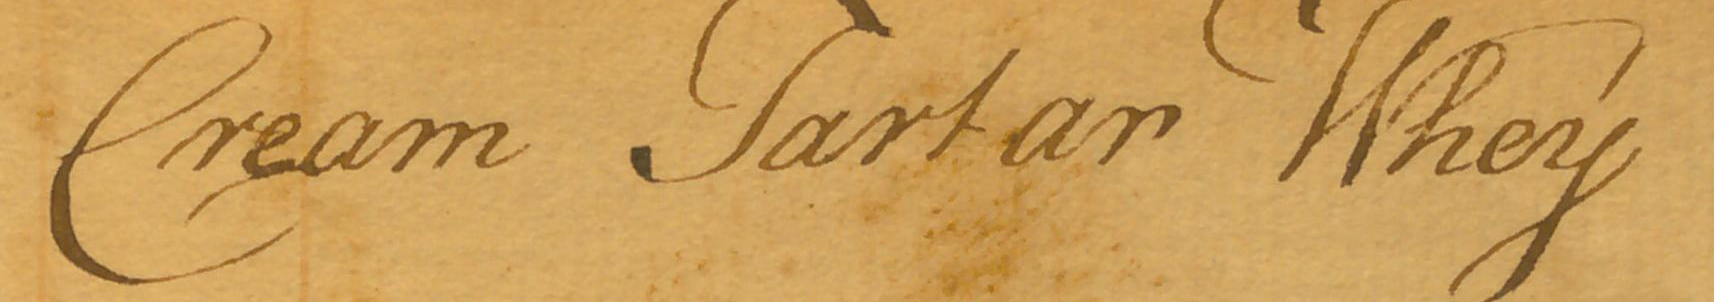Cream Tartar Whey
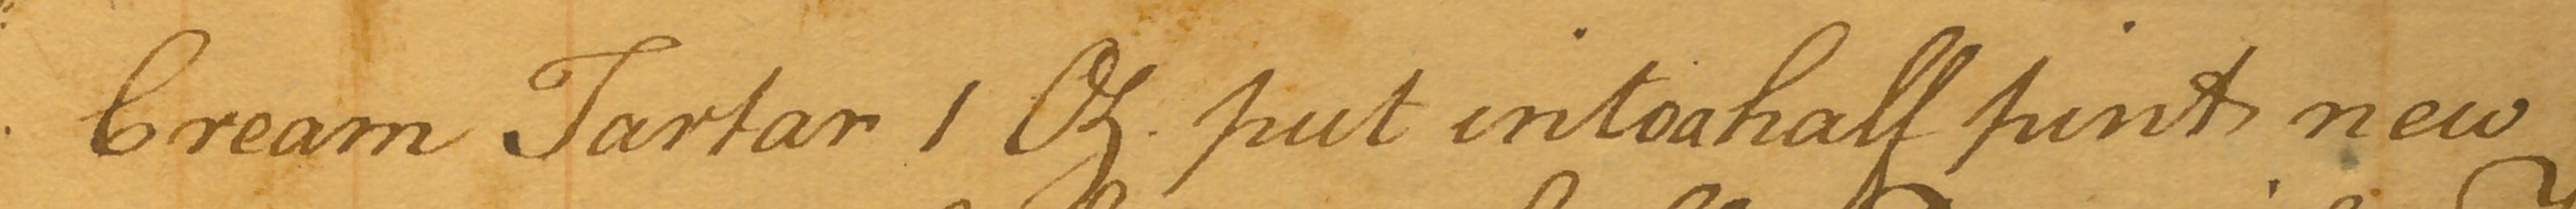Cream Tartar 1 Oz. put into a half pint new
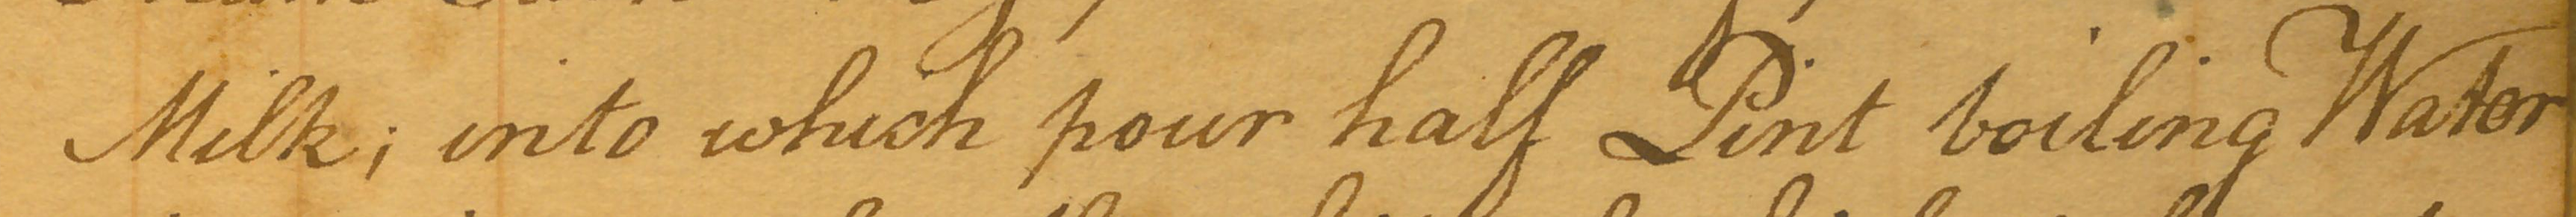Milk; into which pour half Pint boiling Water
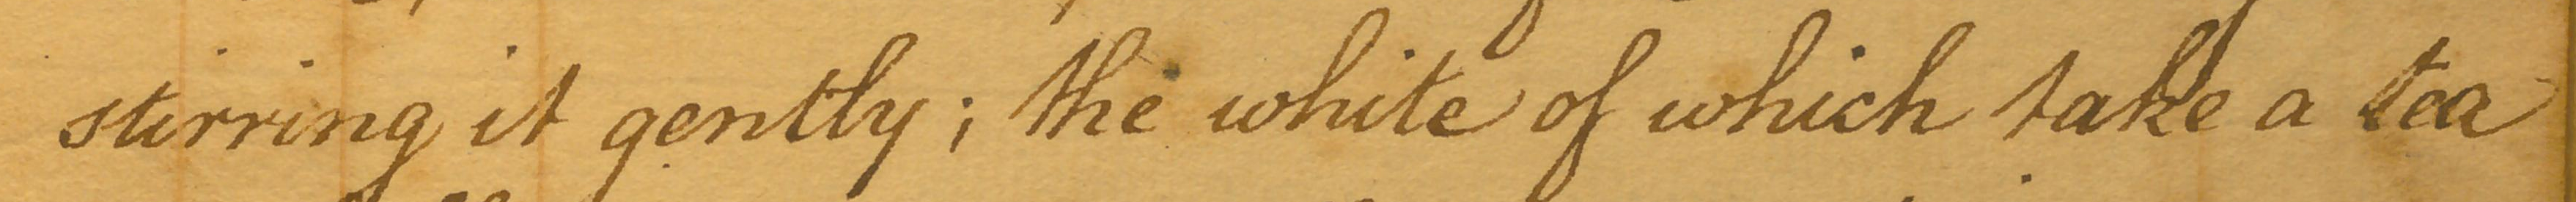stirring it gently; the white of which take a tea
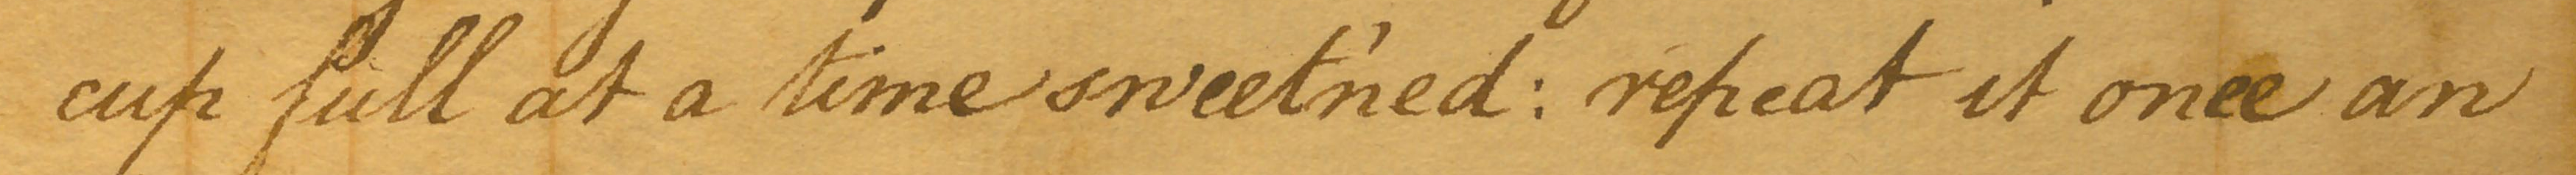cup full at a time sweet'ned: repeat it once an
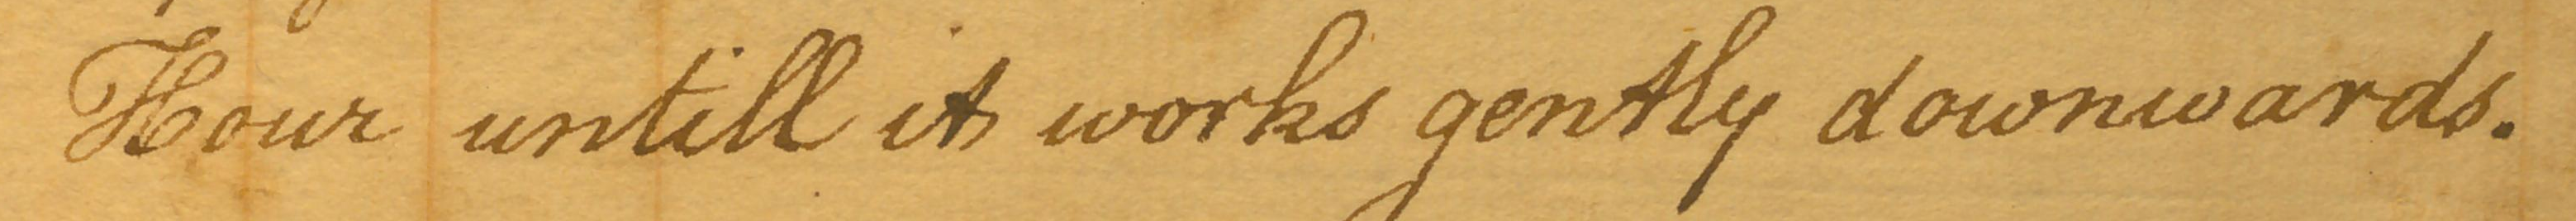Hour until it works gently downwards.
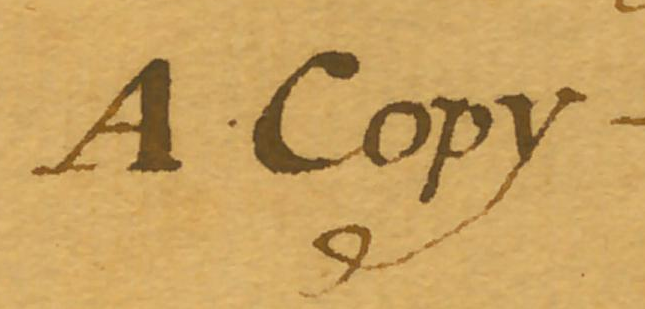A Copy
